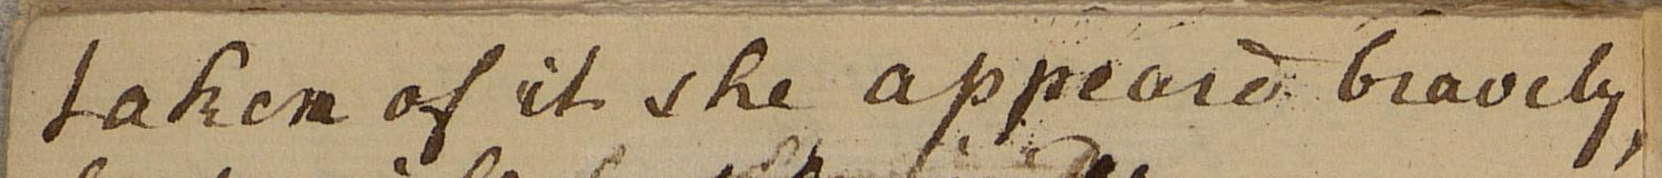taken of it she appeard bravely,
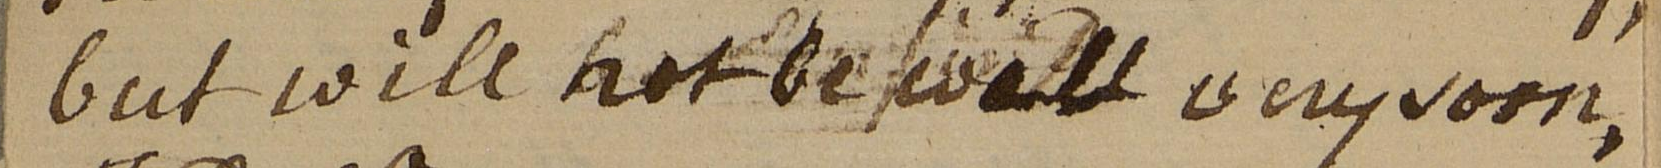but will not be well very soon,
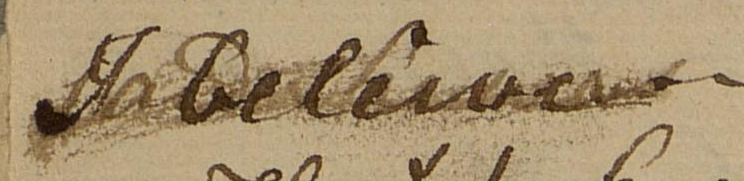I beleive-
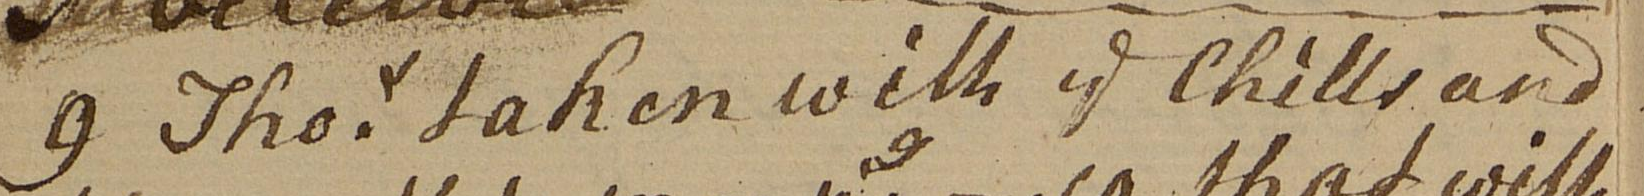9 Tho^s. taken with y^e Chills and
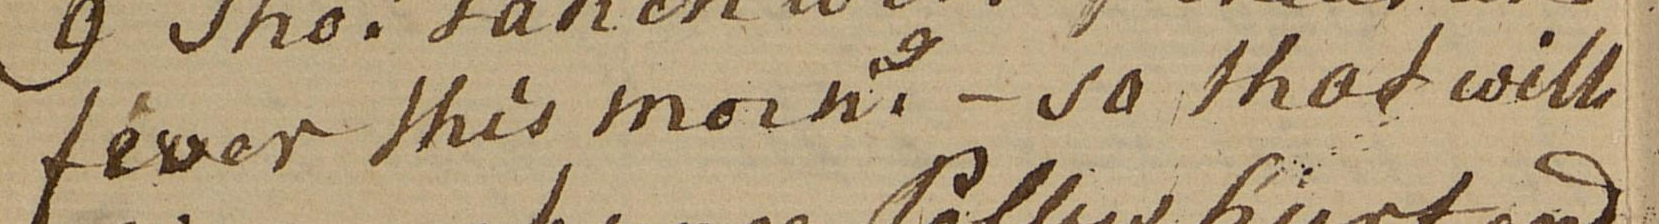fever this morn^g.- so that with
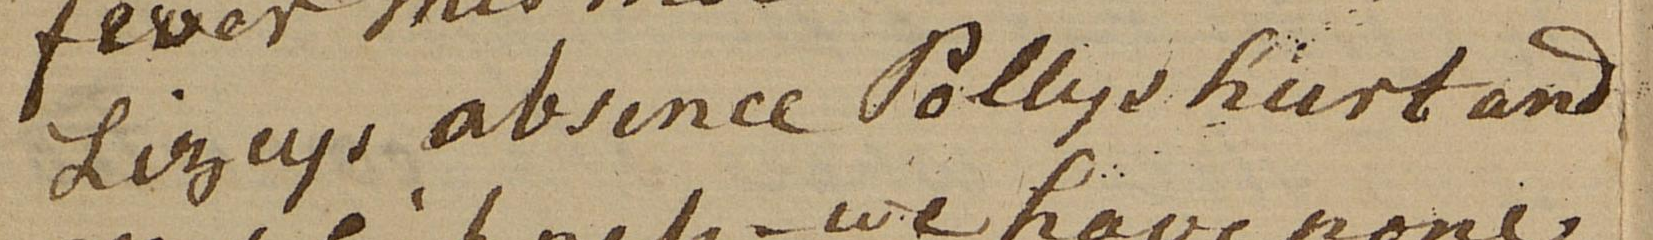Lizeys absence Pollys hurt and
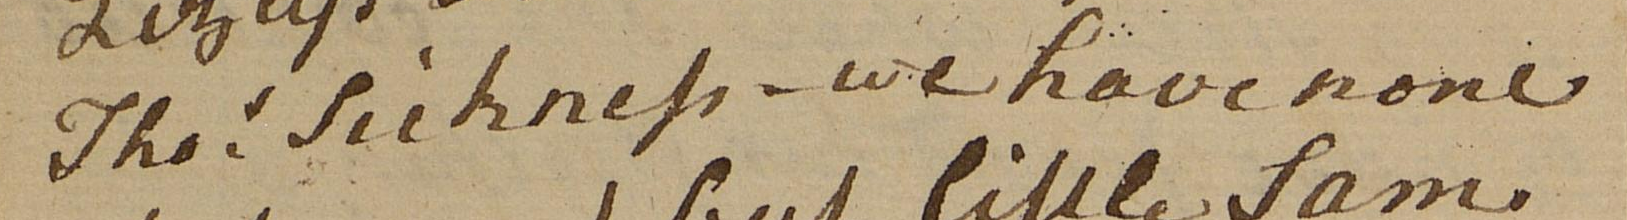Tho^s. Sickness- we have none
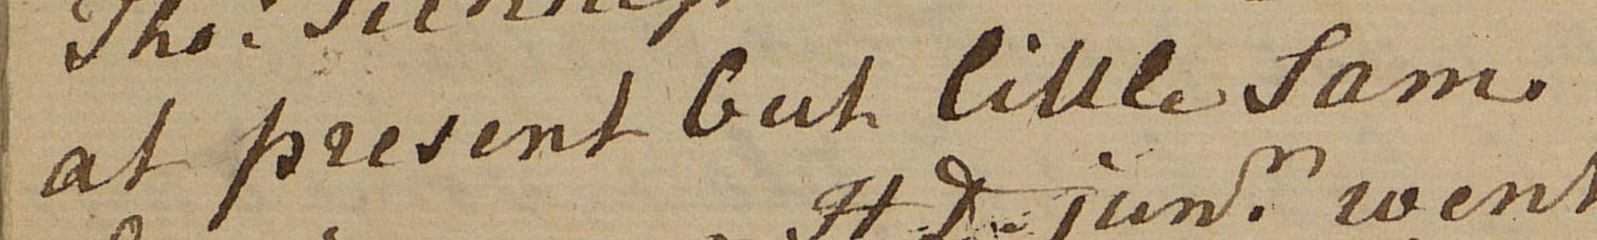at present but little Sam.
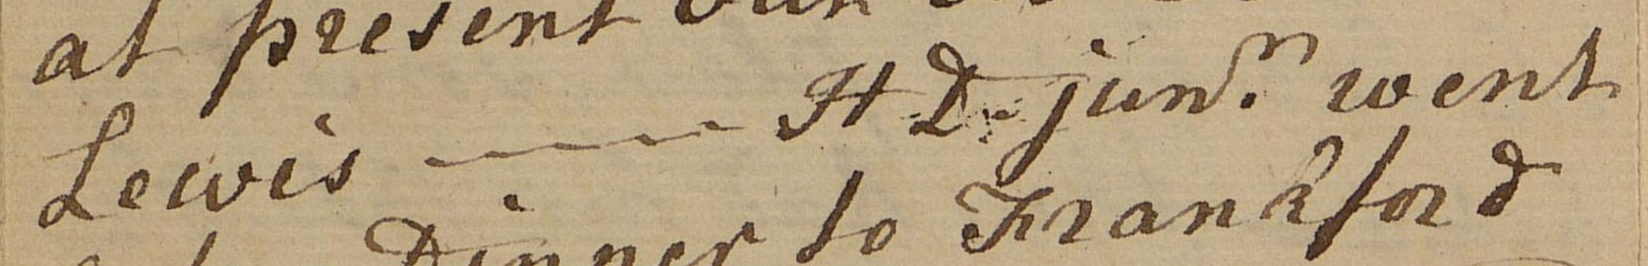Lewis- HD jun^r. went
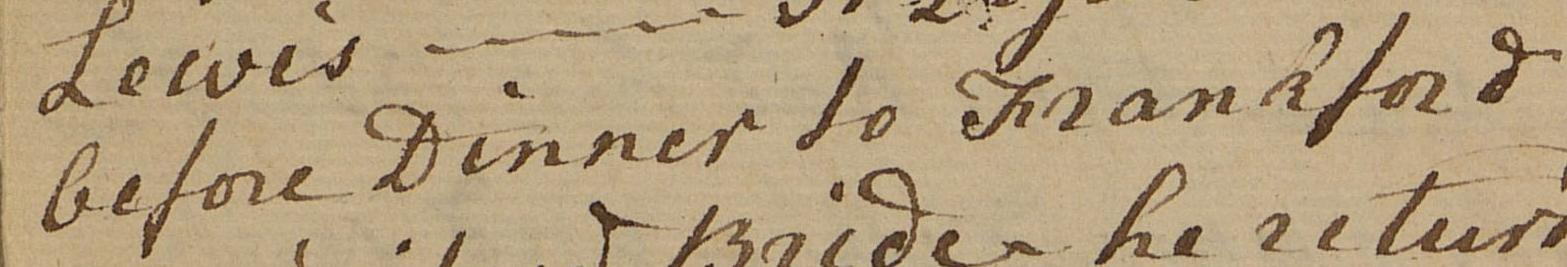before Dinner to Frankford
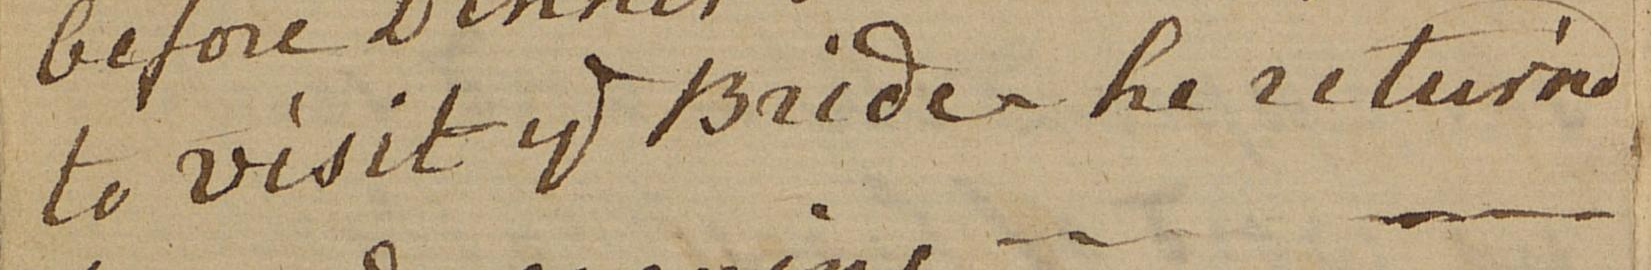to visit y^e Bride- he return'd
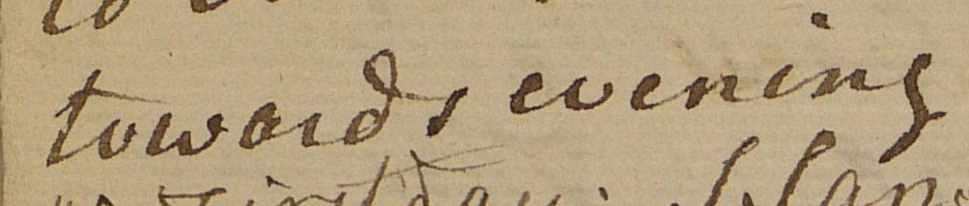towards evening
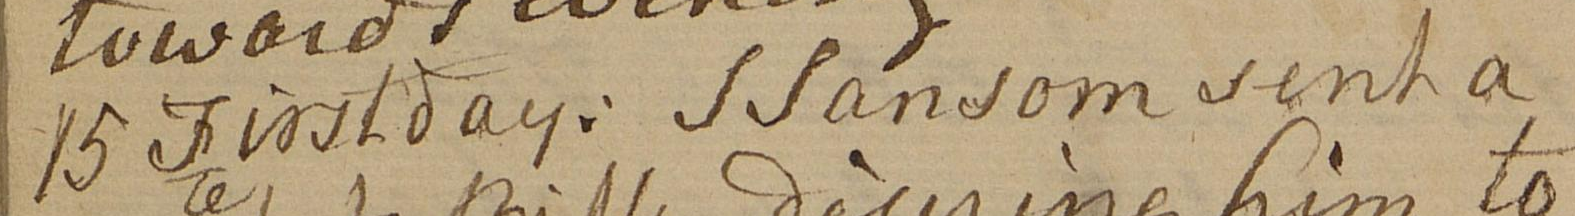15 First day: S Sansom sent a
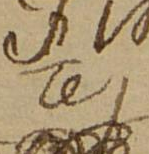te
